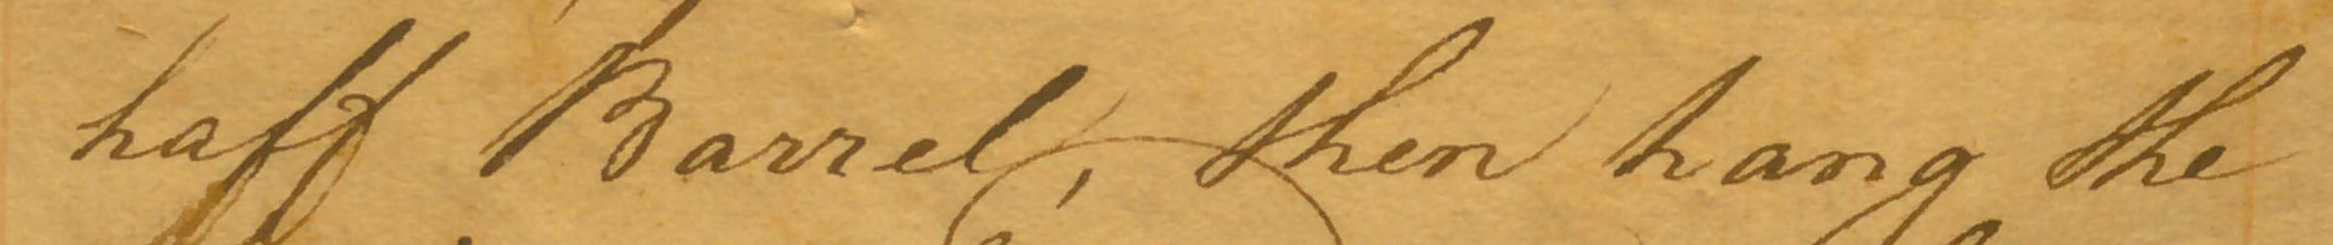half Barrel, then hang the
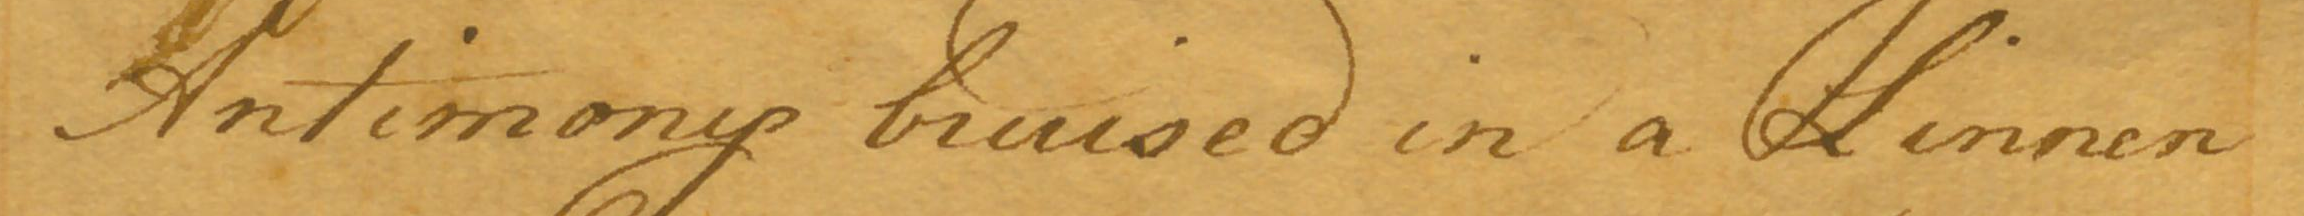Antimony bruised in a Linnen
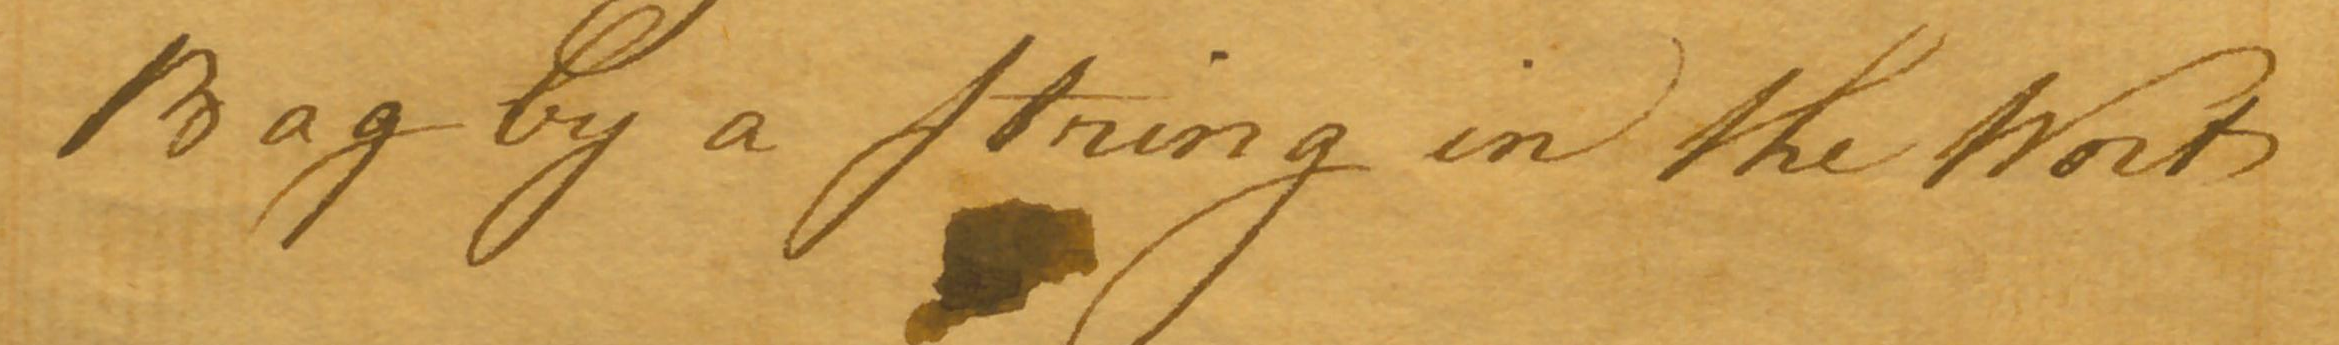Bag by a string in the Wort
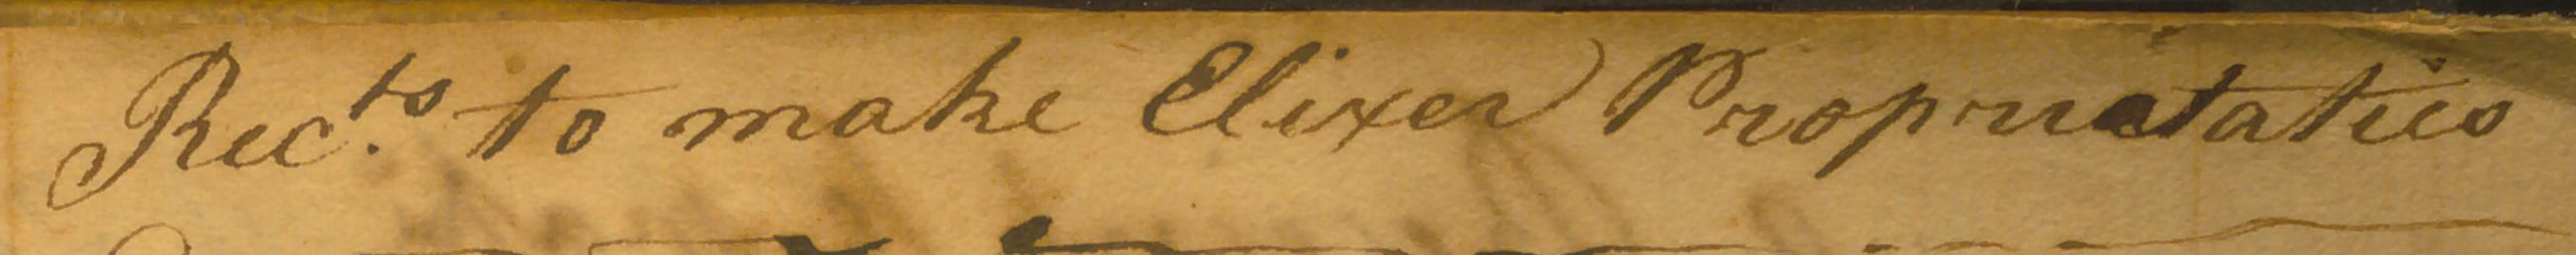Rec^ts. to make Elixer Proprietatus
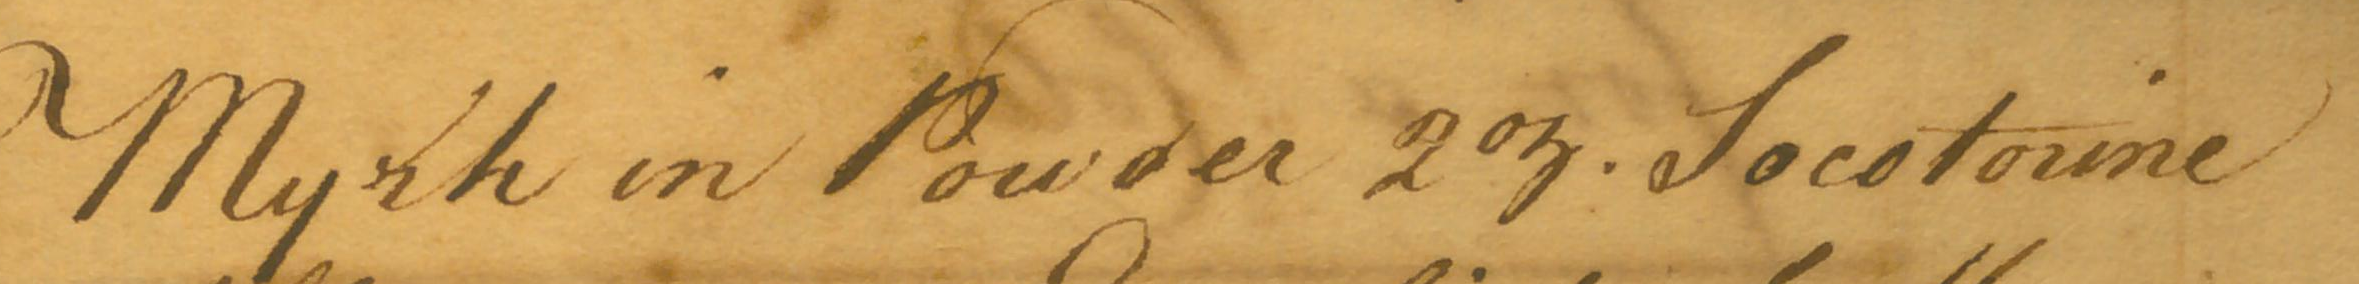Myrh in Powder 2 oz. Socotorine
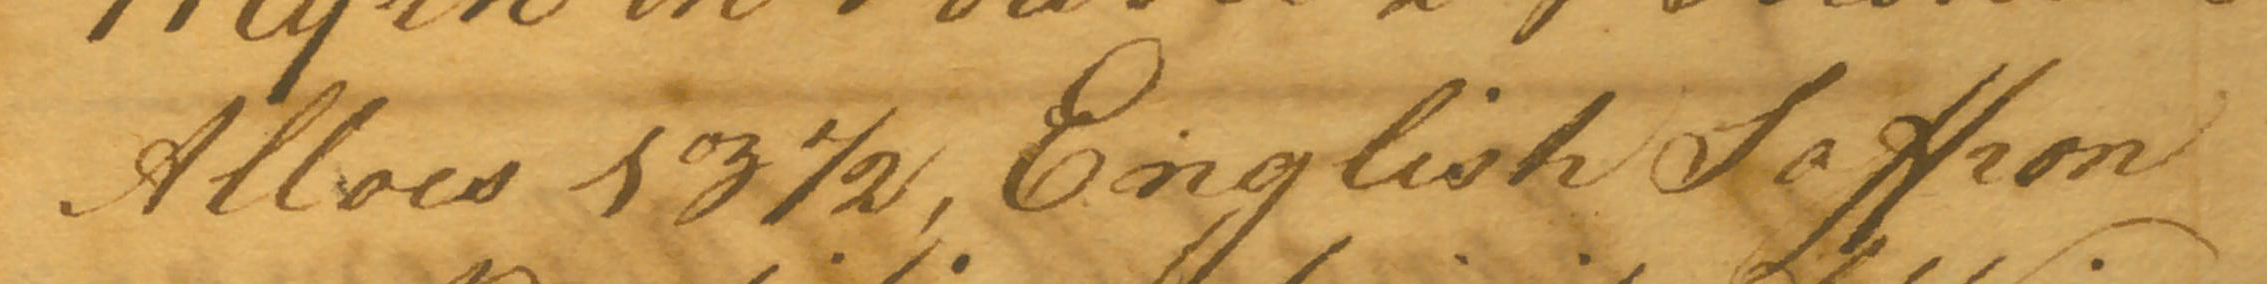Alloes 1oz 1/2 English Saffron
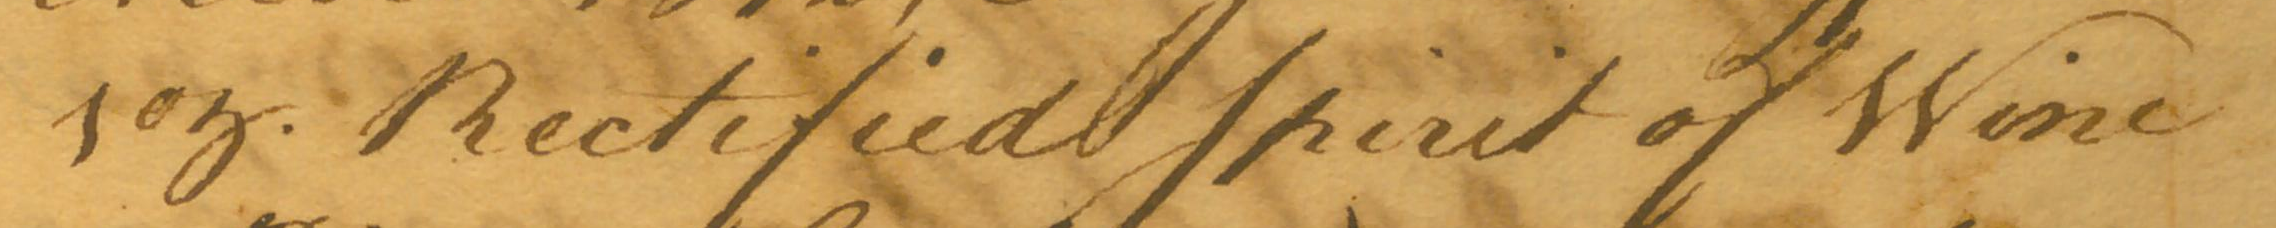1 oz. Rectified spirit of Wine
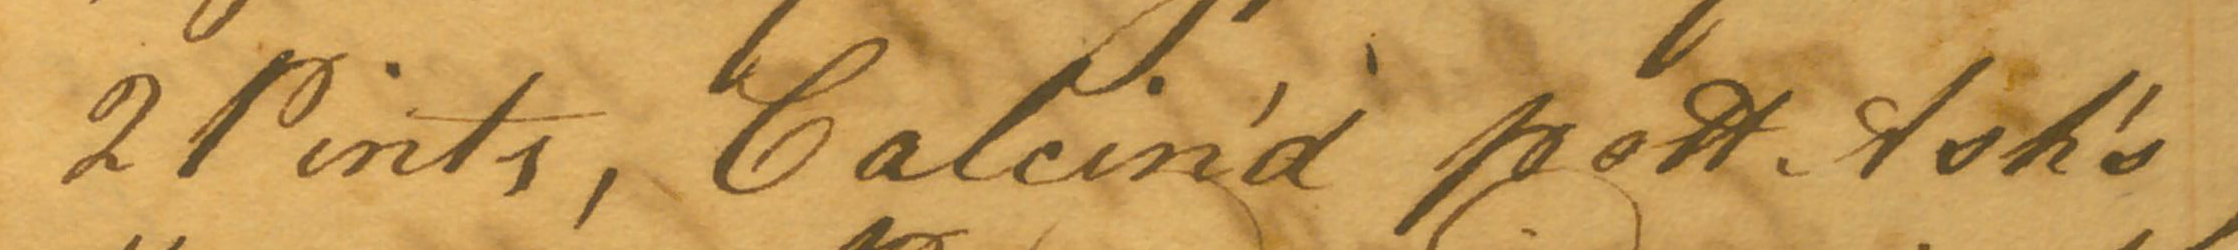2 Pints, Calcin'd pott Ash's
